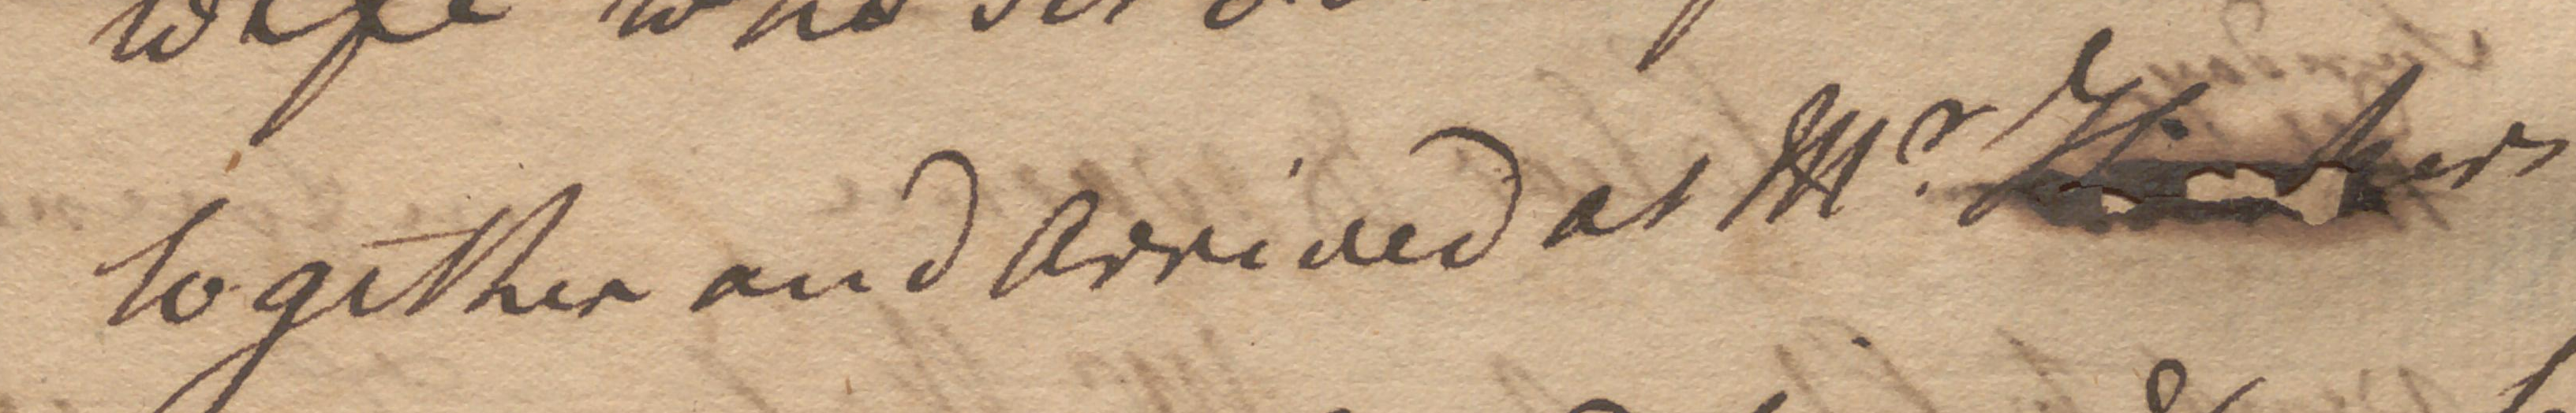to gether and arrived at M^r. [______]
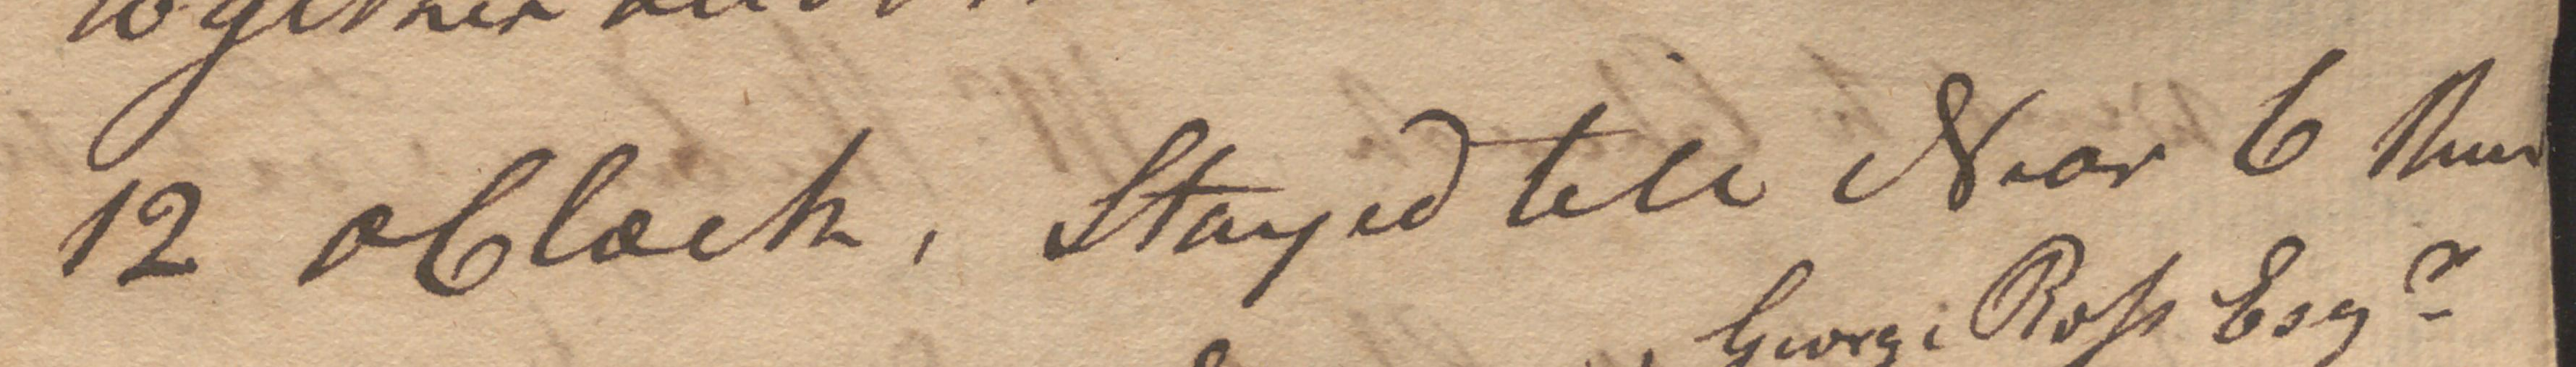12 oClock, Stayed tell Near 6 then
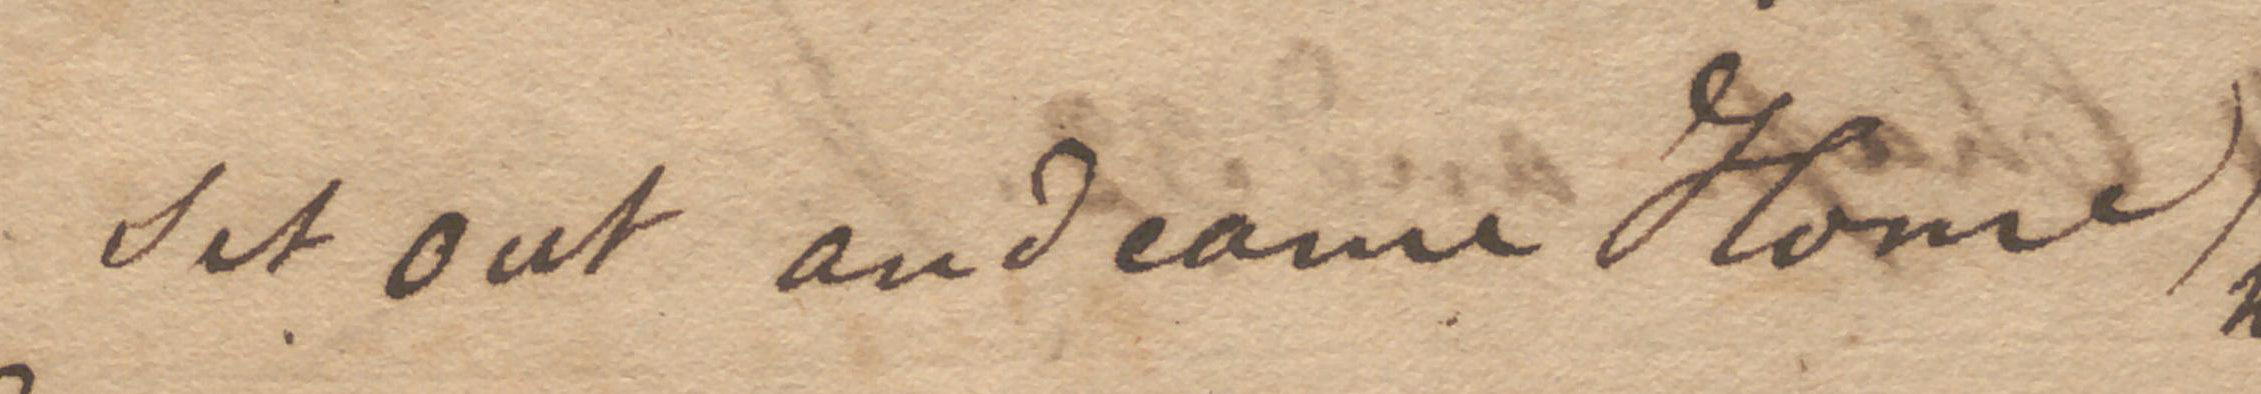set out and came Home
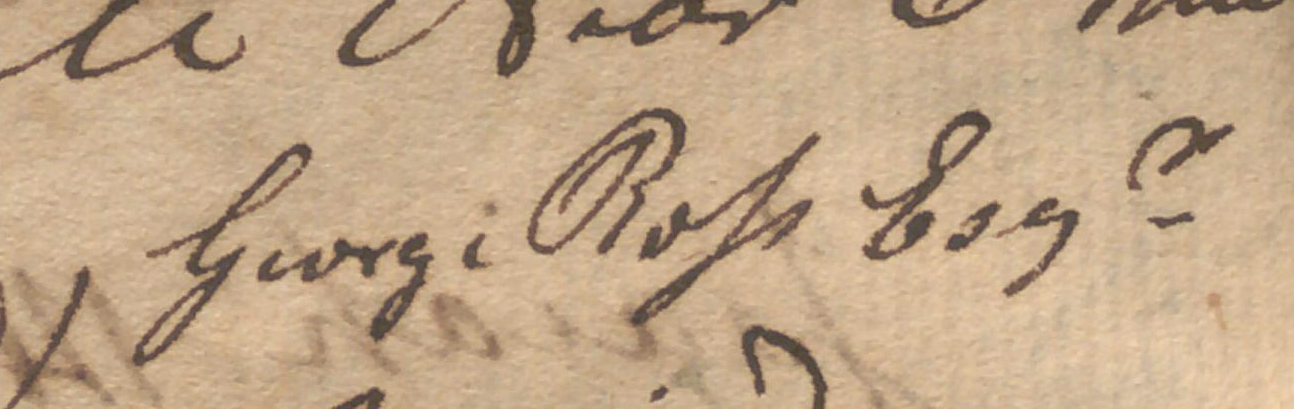George Ross Esq^r.
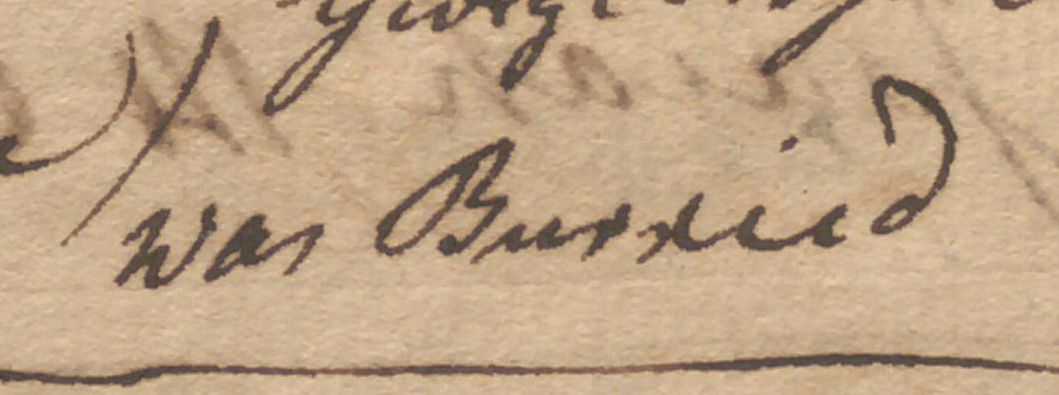was Burried
